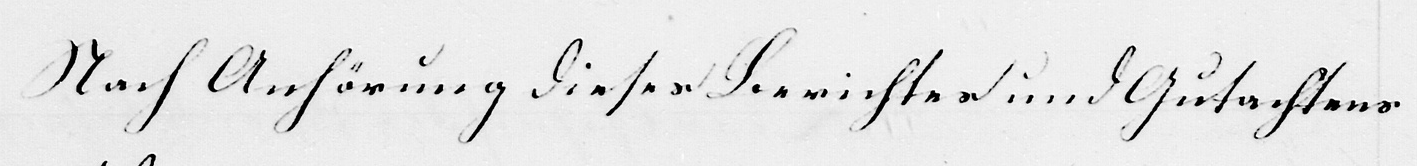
Nach Anhörung dieses Berichtes und Gutachtens
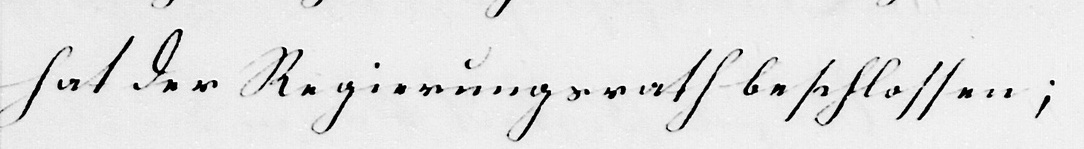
hat der Regierungsrath beschlossen;
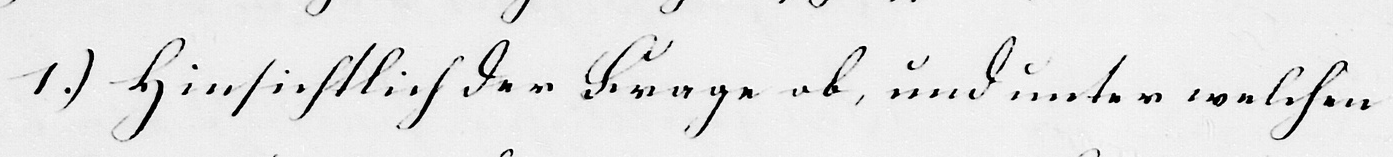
1.) Hinsichtlich der Frage ob, und unter welchen
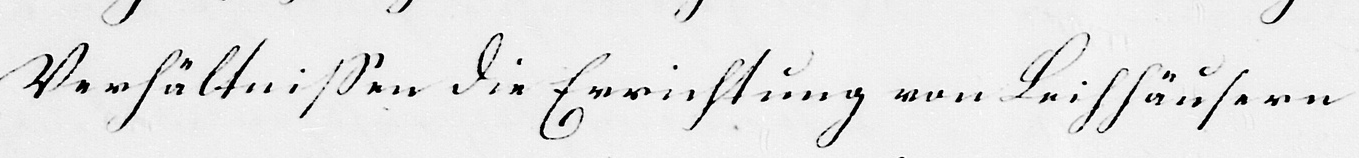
Verhältnißen die Errichtung von Leihhäusern
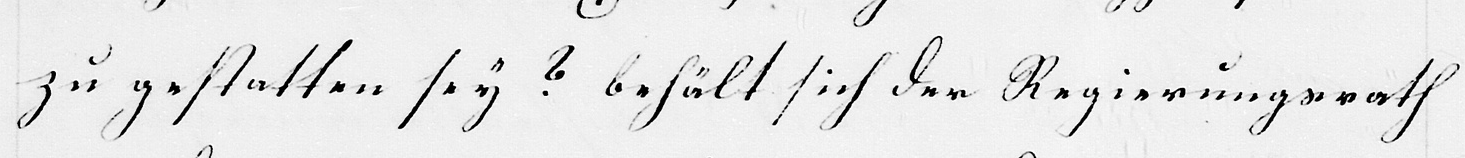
zu gestatten sey? behält sich der Regierungsrath
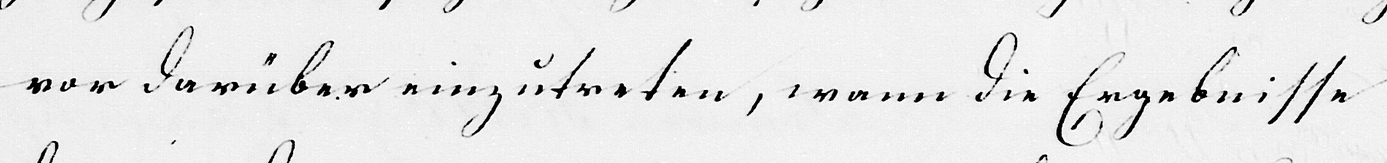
vor darüber einzutreten, wann die Ergebnisse
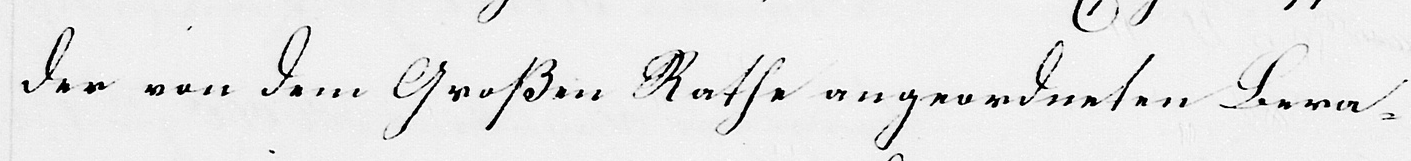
der von dem Großen Rathe angeordneten Bera¬
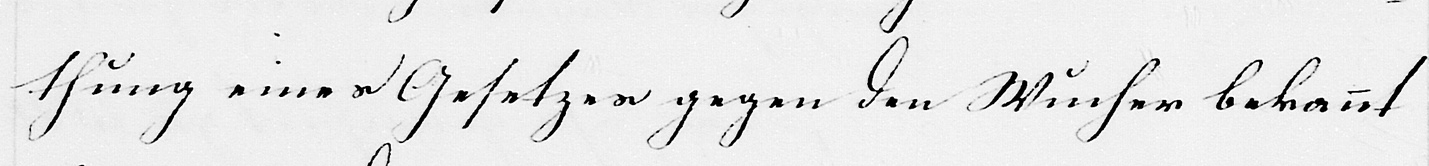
thung eines Gesetzes gegen den Wucher bekannt
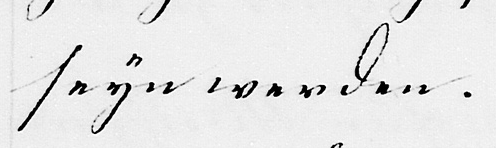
seyn werden.
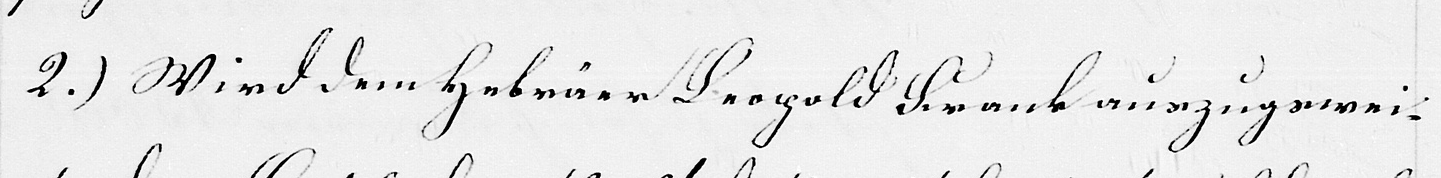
2.) Wird dem Hebräer Leopold Frank auszugswei¬
